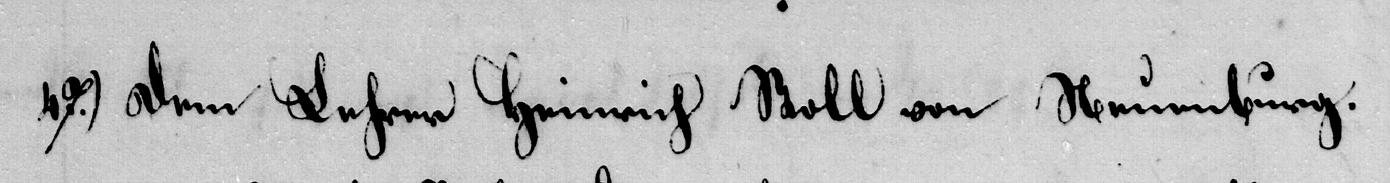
47.) Dem Lehrer Heinrich Stoll von Neuenburg.
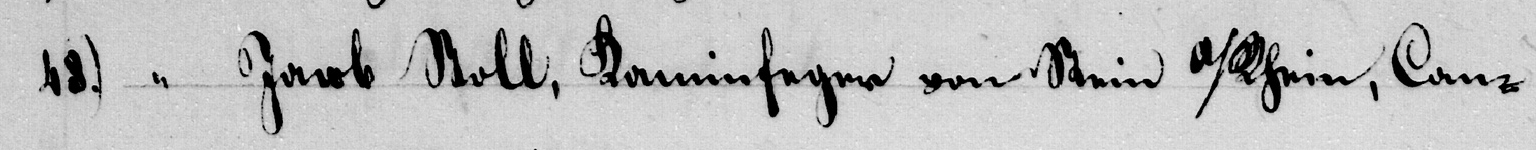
48.) Dem Jacob Stoll, Kaminfeger von Stein a/Rhein, Can¬
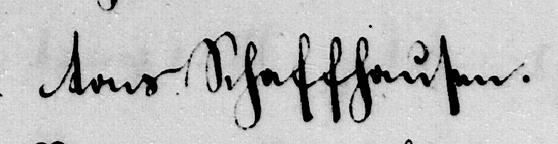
tons Schaffhausen.
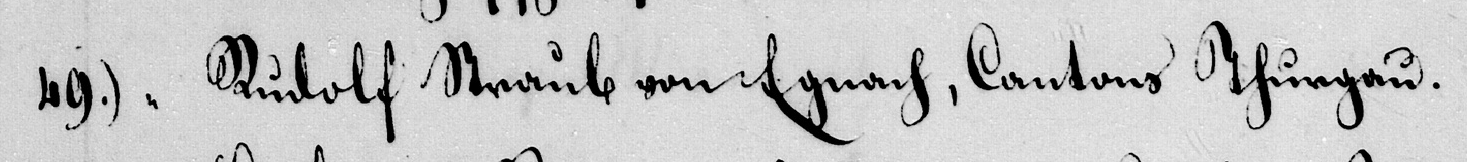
49.) “ Rudolf Straule von Egnach, Cantons Thurgau.
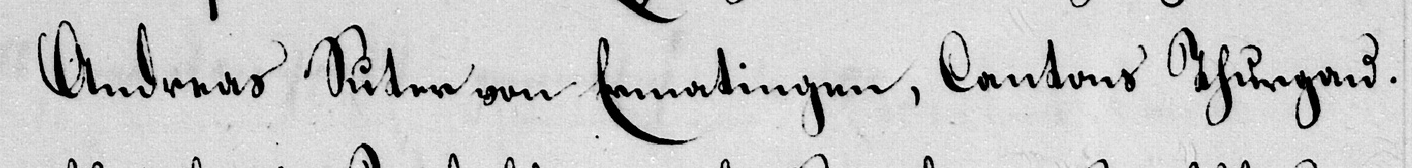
Andreas Suter von Ermatingen, Cantons Thurgau.
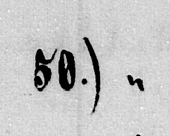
59.) “
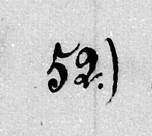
52.)
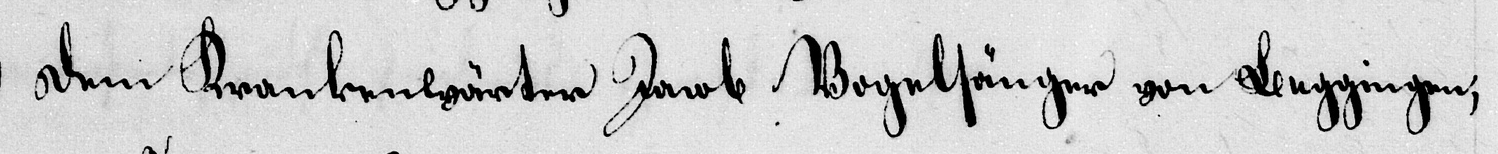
Dem Krankenwärter Jacob Vogelsänger von Beppingen,
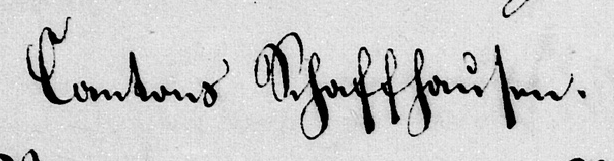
Cantons Schaffhausen.
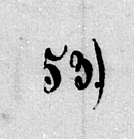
53.)
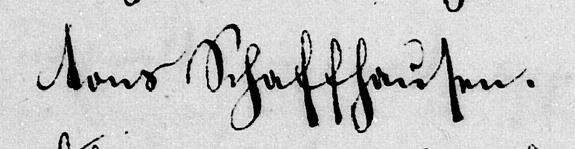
tons Schaffhausen.
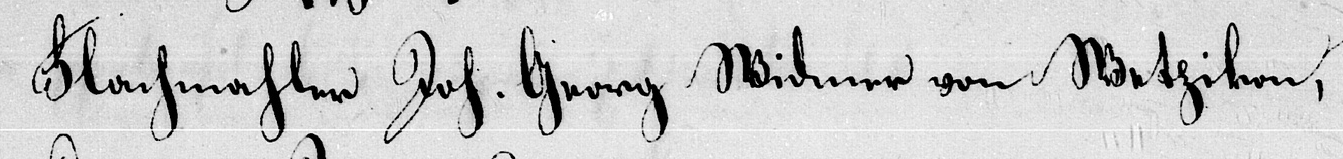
Flachmahler Joh. Georg Widmer von Wetzikon,
